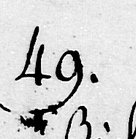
292.
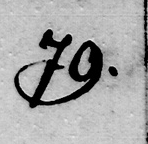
320.
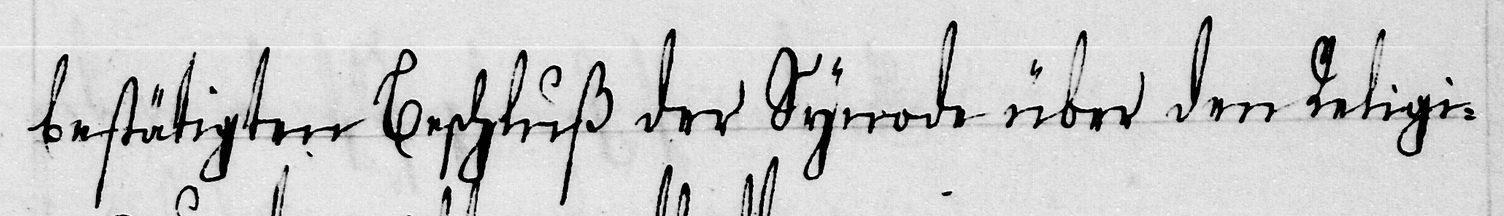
bestätigten Beschluß der Synode über den Religi¬
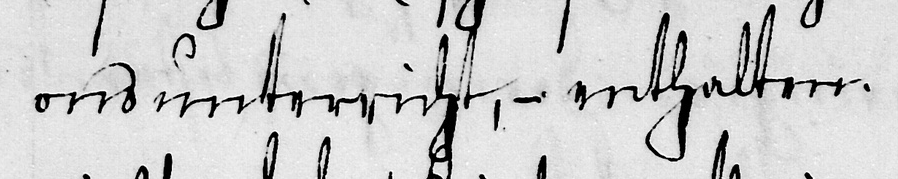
onsunterricht, – enthalten.
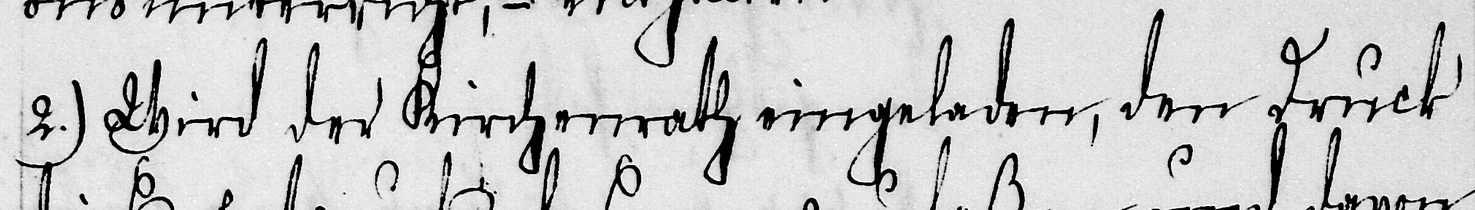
2.) Wird der Kirchenrath eingeladen, den Druck
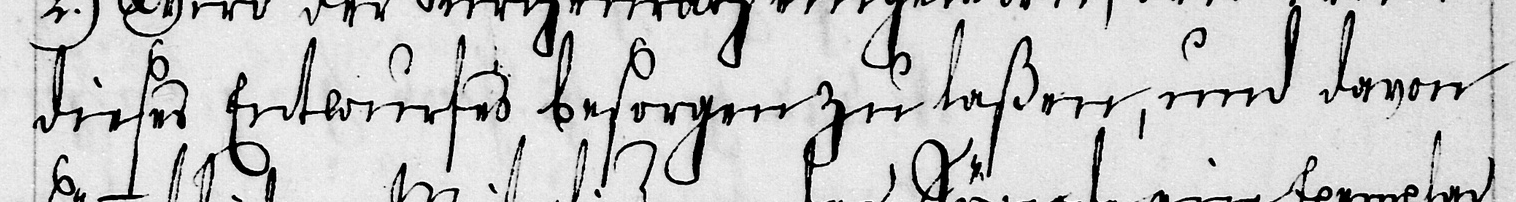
dieses Entwurfes besorgen zu laßen, und davon
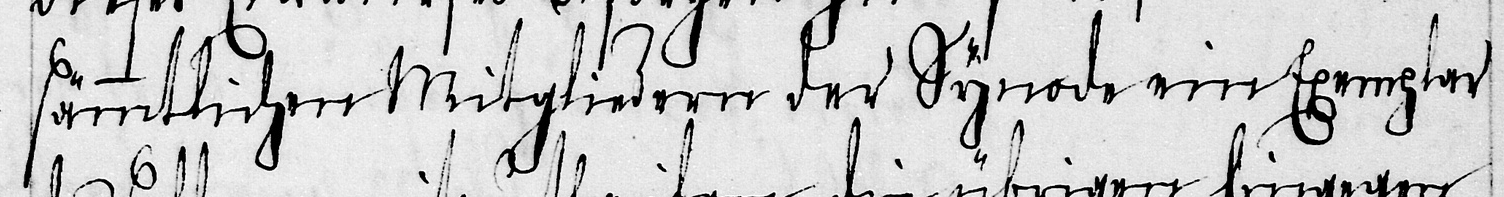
sämmtlichen Mitgliedern der Synode ein Exemplar
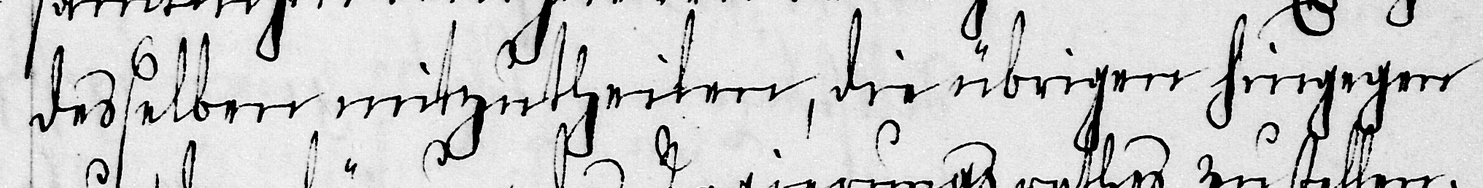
desselben mitzutheilen, die übrigen hingegen
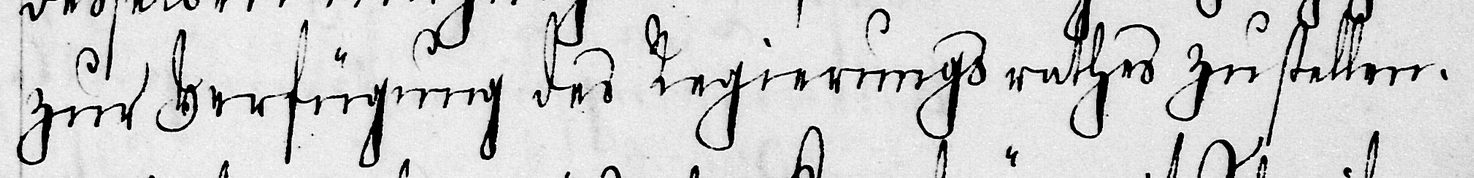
zur Verfügung des Regierungsrathes zu stellen.
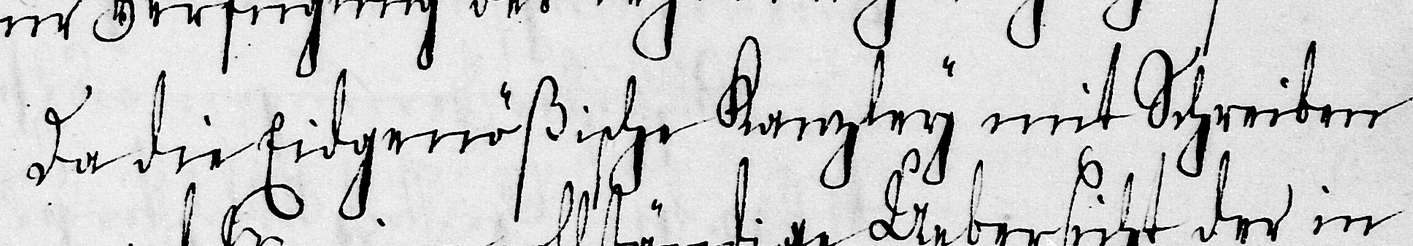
Da die Eidgenößische Kanzley mit Schreiben
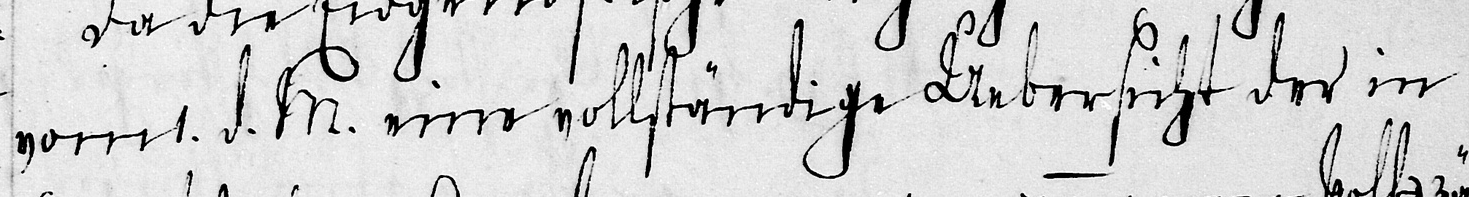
vom 1. d. M. eine vollständige Uebersicht der in
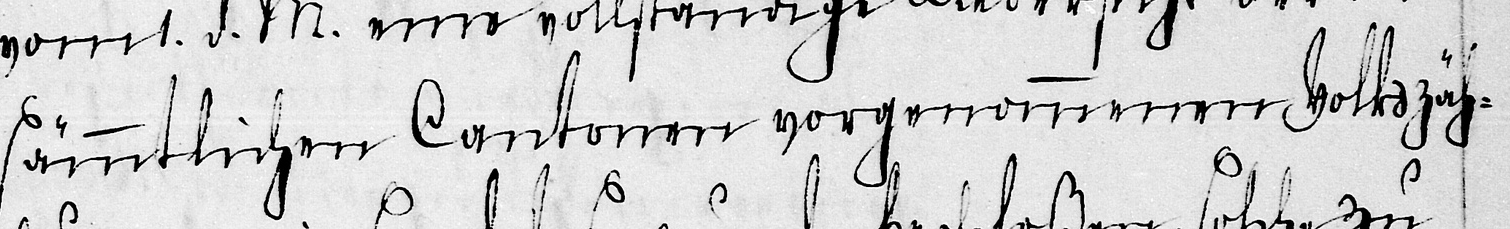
sämmtlichen Cantonen vorgenommenen Volkszäh¬
